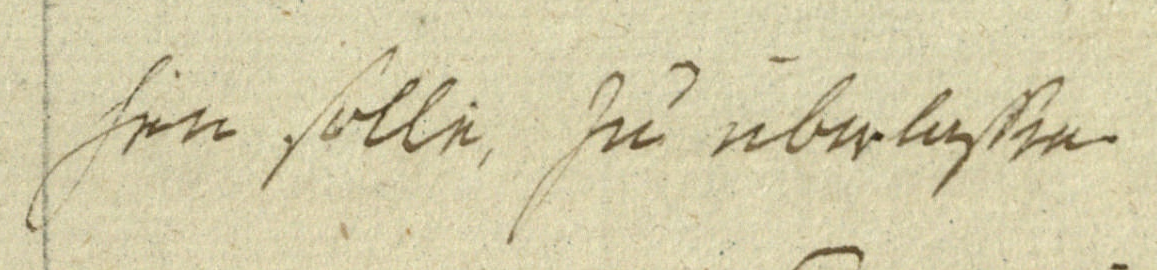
hen solle, zu überlassen.
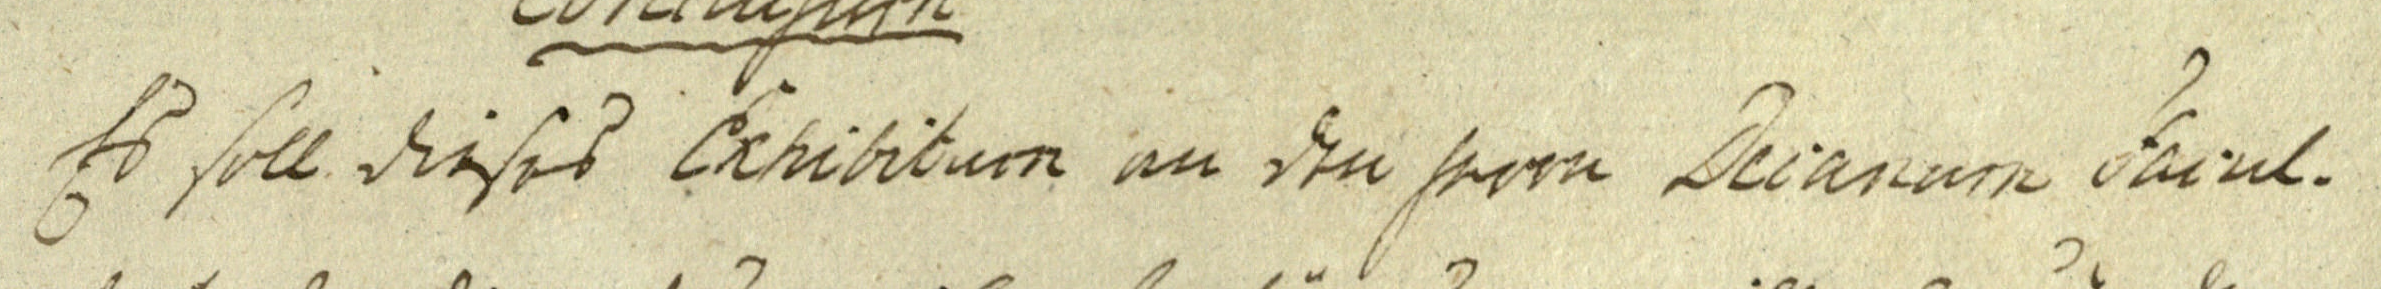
Es soll dieses Exibitum an den Herrn Decanum Facul¬
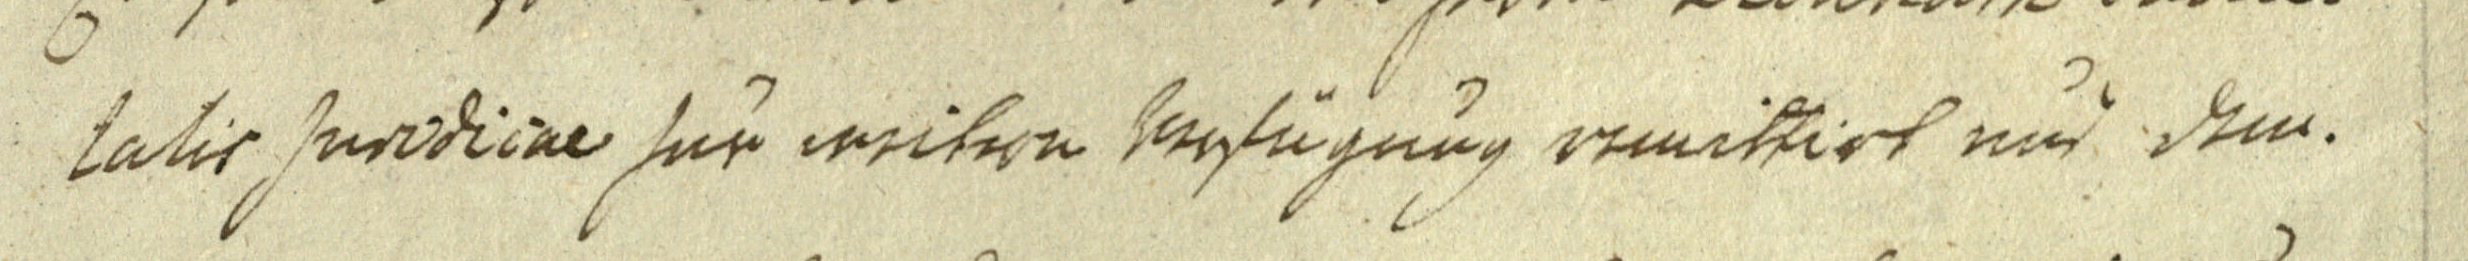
tatis Juridicae zur weitern Verfügung remittirt und dem¬
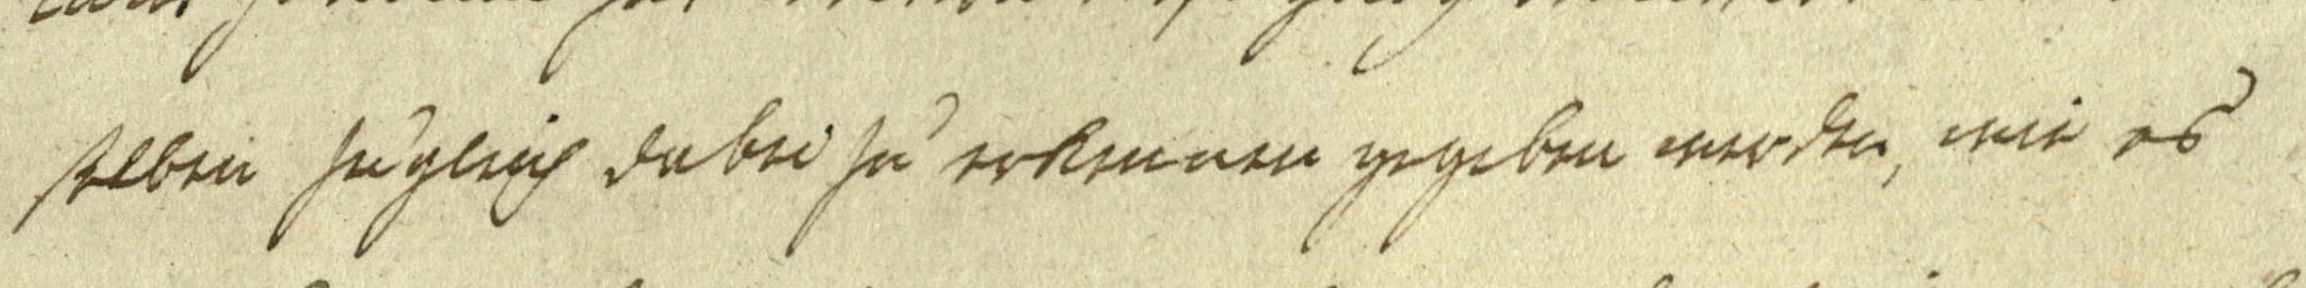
selben zugleich dabei zu erkennen gegeben werden, wie es
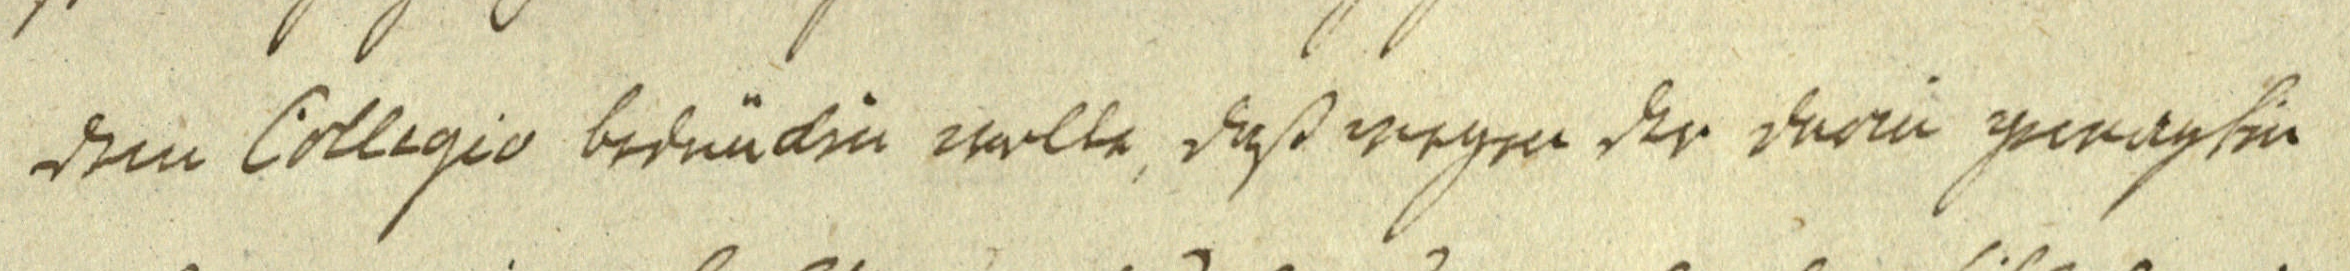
dem Collegio bedüncken wolle, daß wegen der darin gewagten
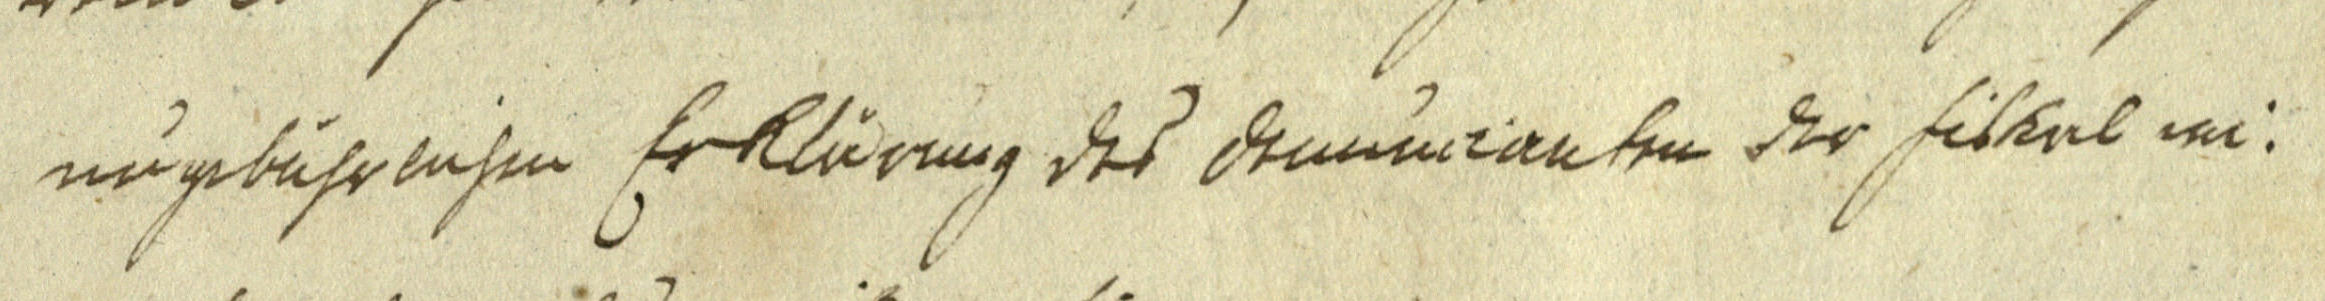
ungebührlichen Erklärung des Denuncianten der Fiskal wi¬
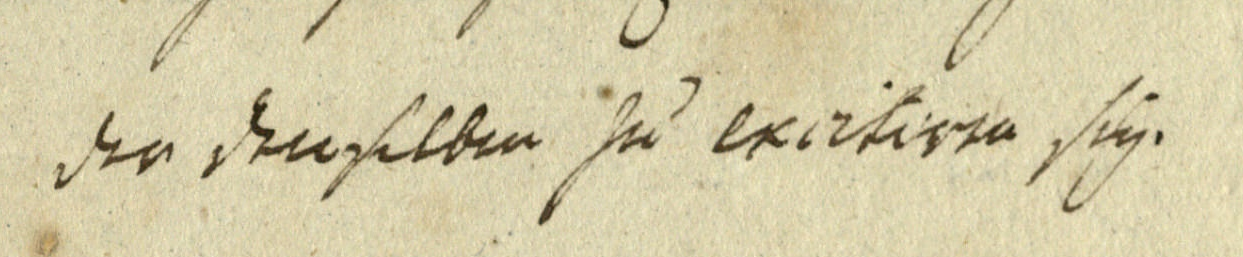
der denselben zu excitiren seÿ.
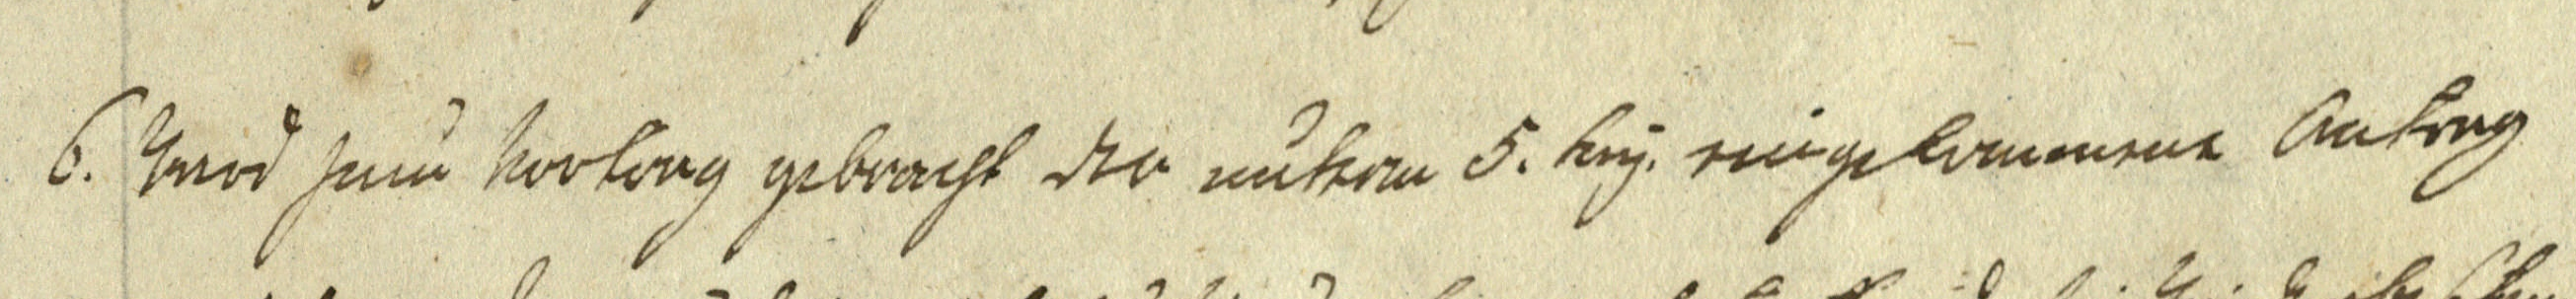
6. Ward um Vortrag gebracht der unterm 5. huj. eingekommene Antrag
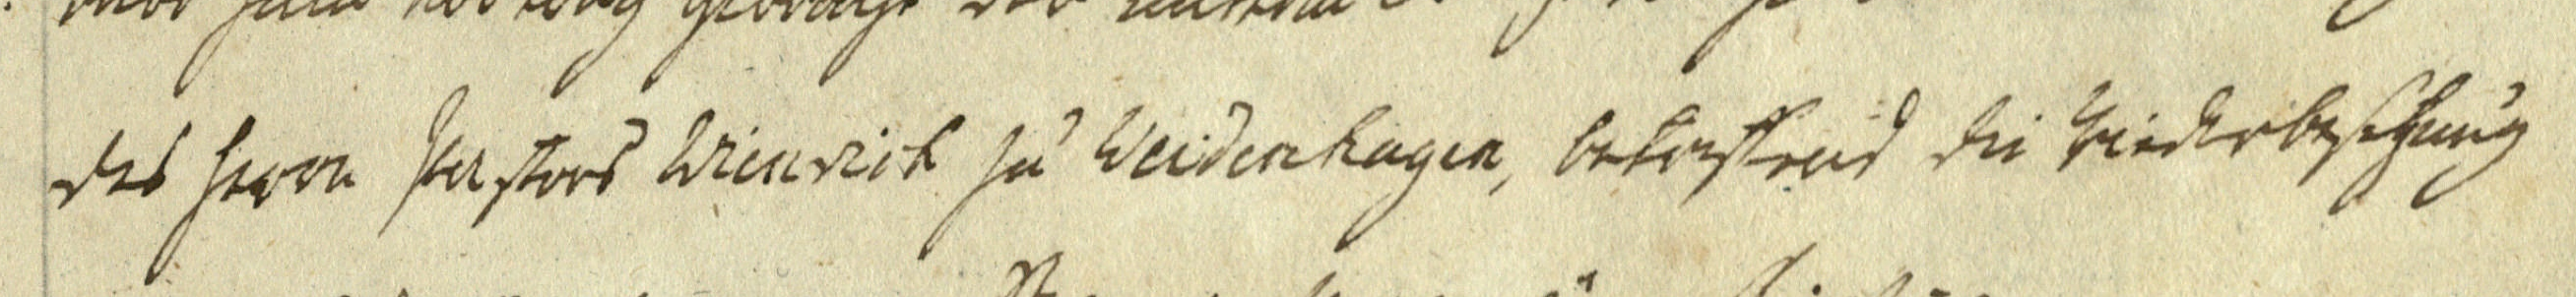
des Herr Pastors Wienrich zu Weidenhagen, betreffend die Wiederbesetzung
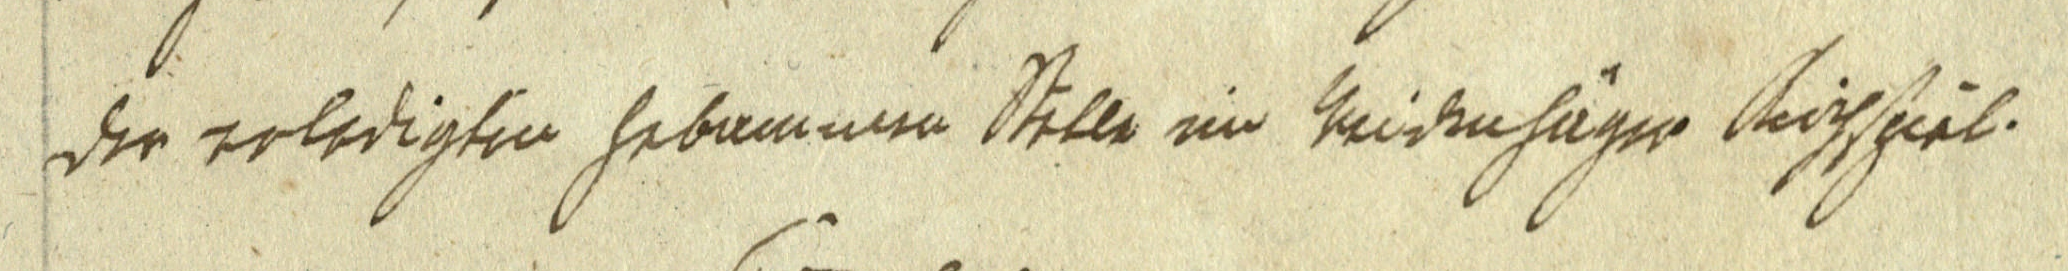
der erledigten Hebammen Stelle im Weidenhäger Kirchspiel.
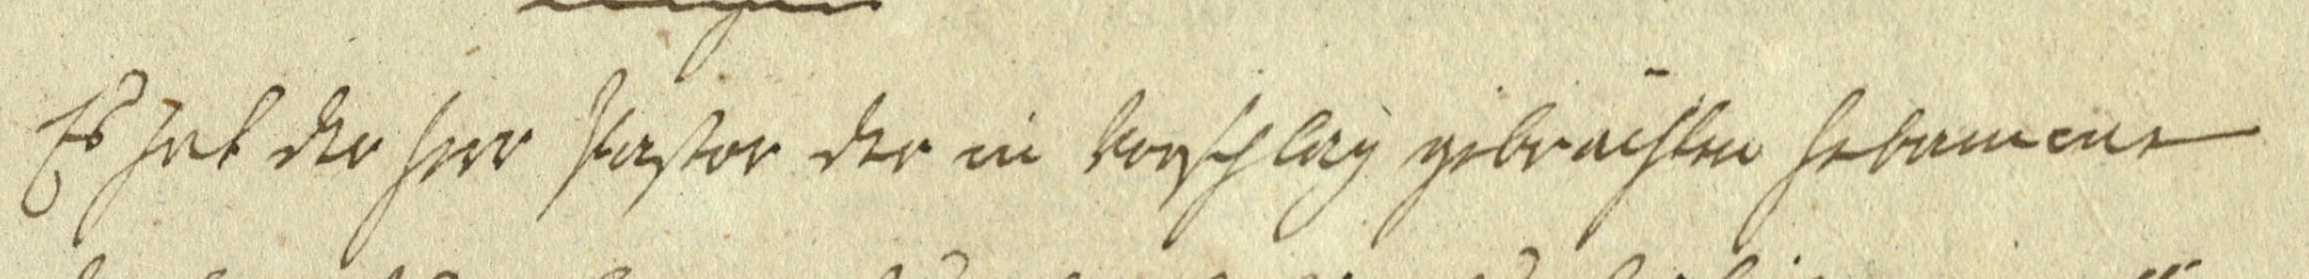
Es hat der Herr Pastor der in Vorschlag gebrachten Hebamme
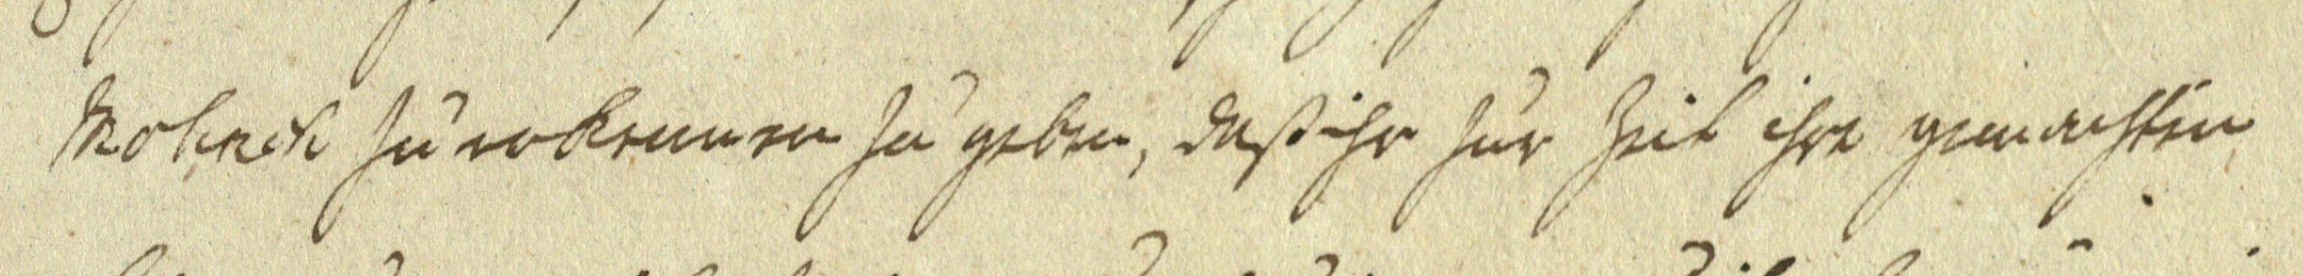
Mohnck zu erkennen zu geben, daß ihr zur Zeit ihre gemachten
